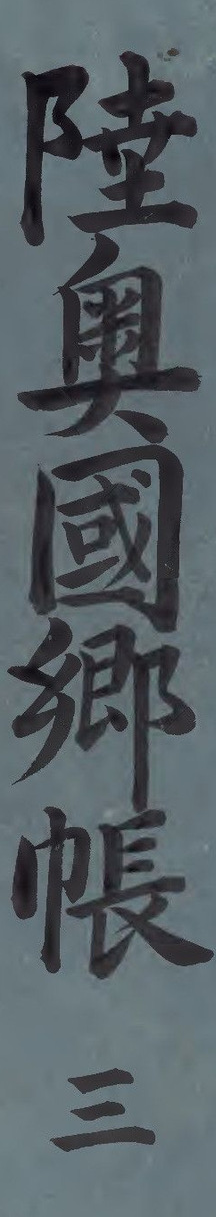陸奥国郷帳三

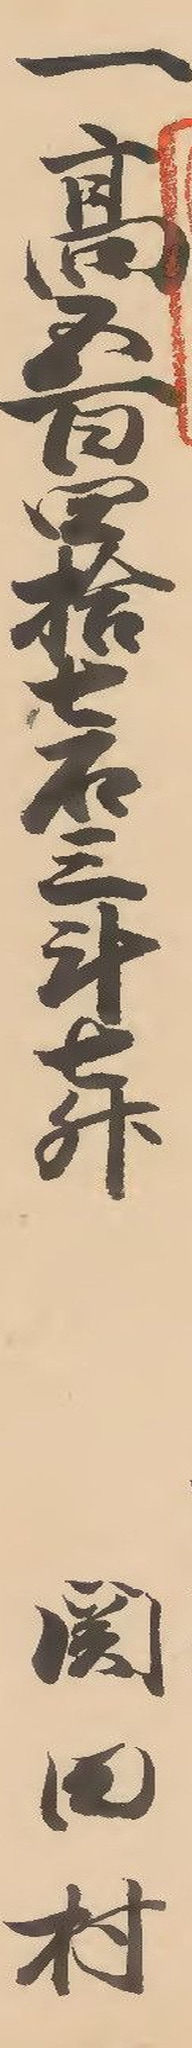一高五百四拾七石三斗七升関田村
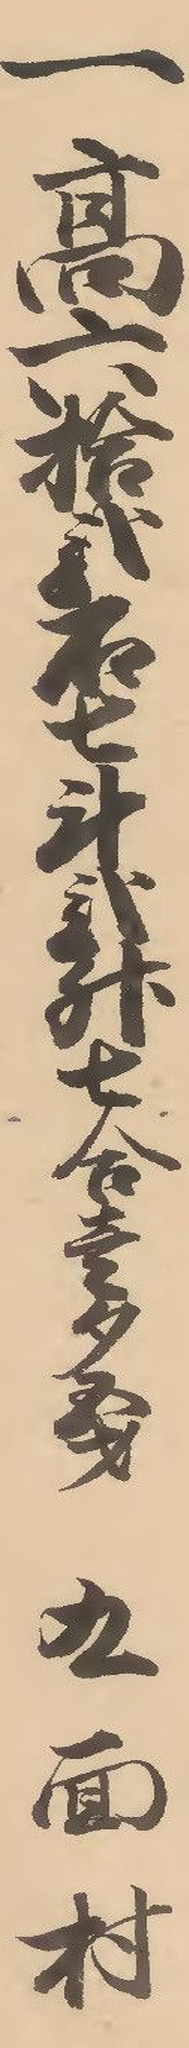一高六拾弐石七斗弐升七合壱勺五才九面村

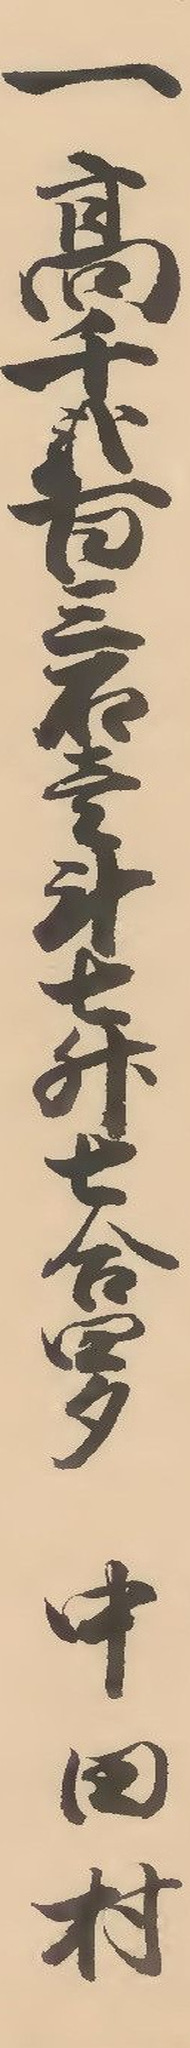一高千弐百三石壱斗七升七合四勺中田村
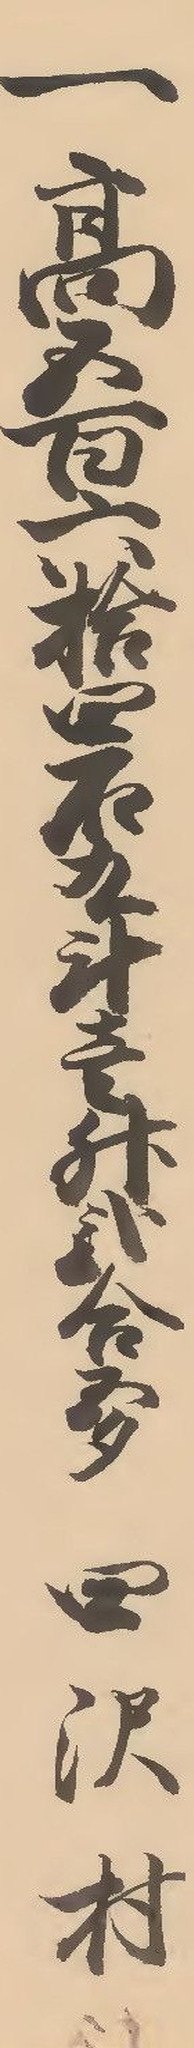一高五百六拾四石九斗壱升弐合五勺四沢村
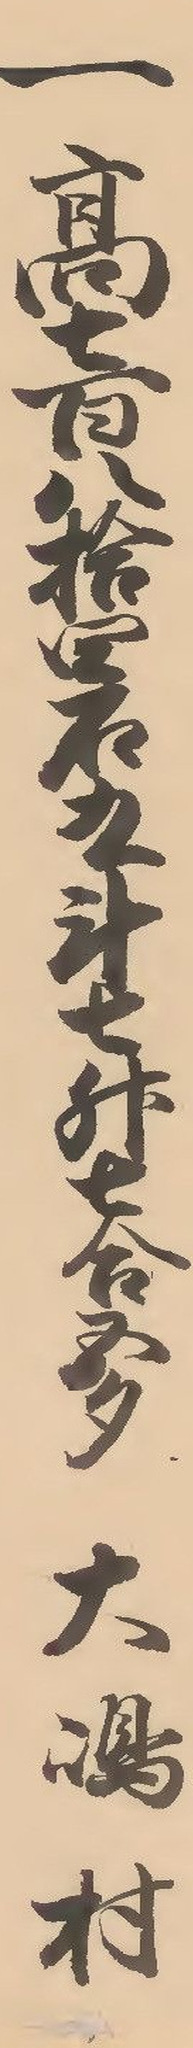一高七百八拾四石九斗七升七合五勺大島村
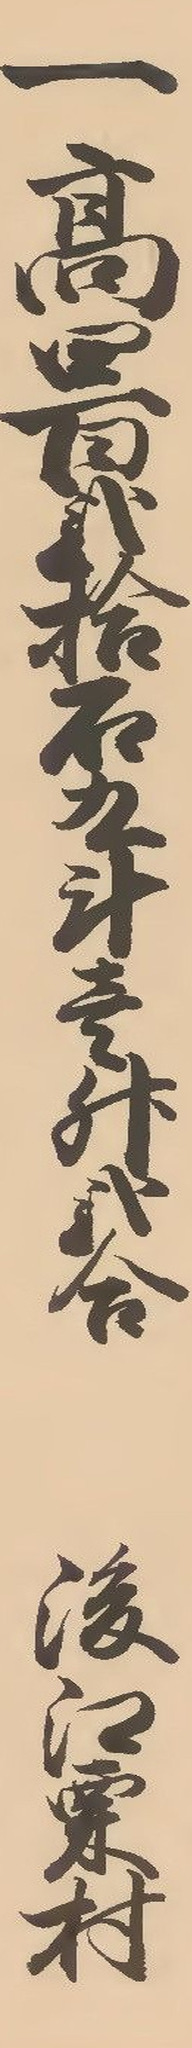一高四百弐拾石九斗壱升弐合後江栗村
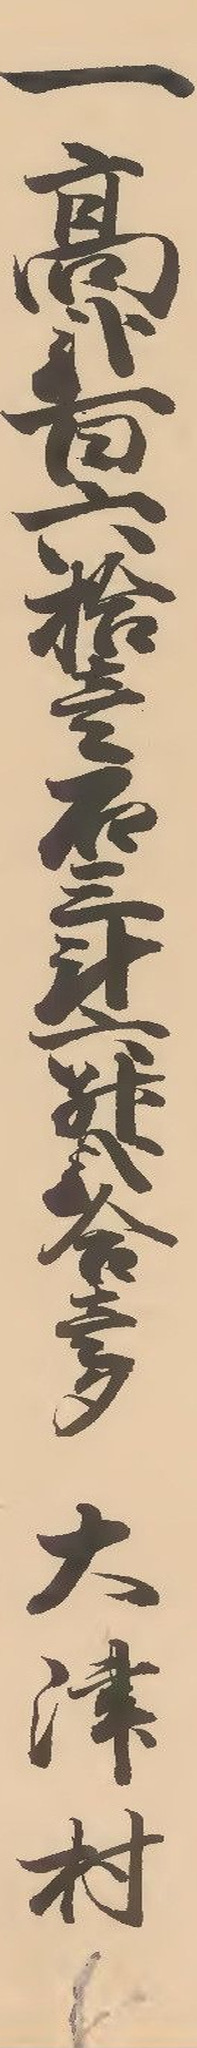一高弐百六拾壱石三斗六升弐合壱勺大津村
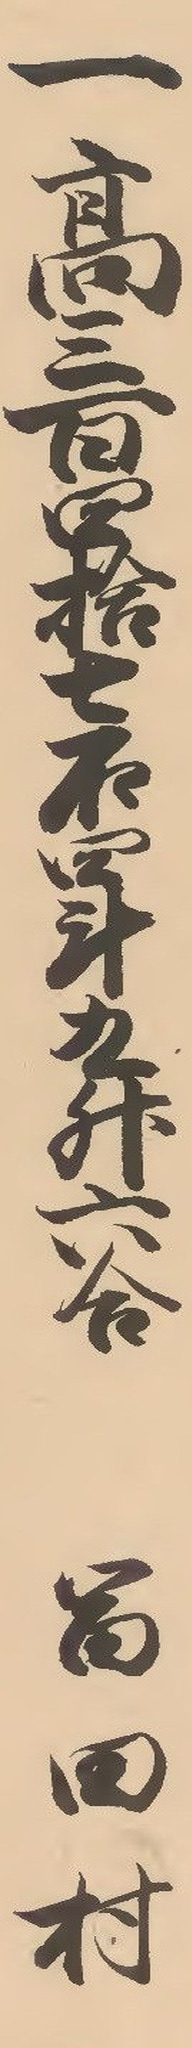一高三百四拾七石四斗五升六合富田村

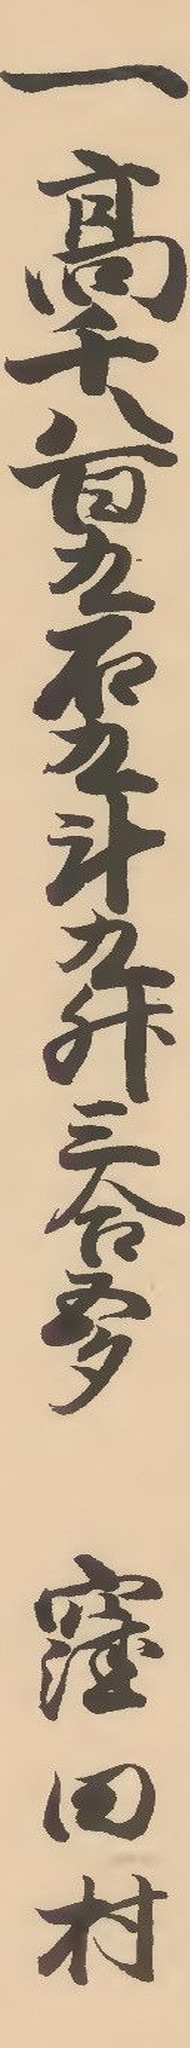一高千八百九石九斗九升三合五勺窪田村
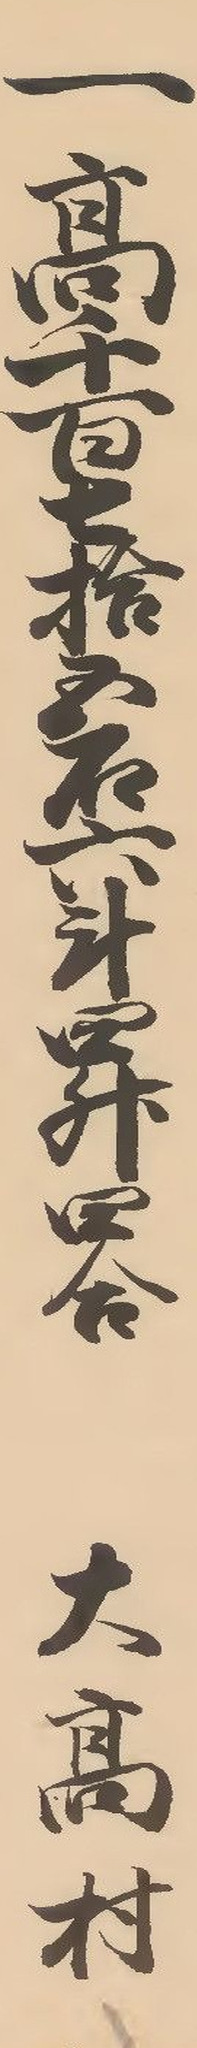一高千百七拾五石六斗四升四合大高村
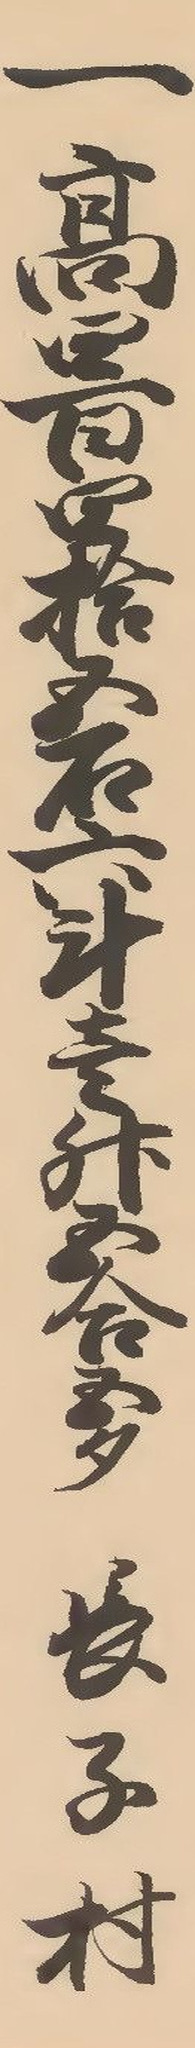一高四百四拾五石六斗壱升五合五勺長子村
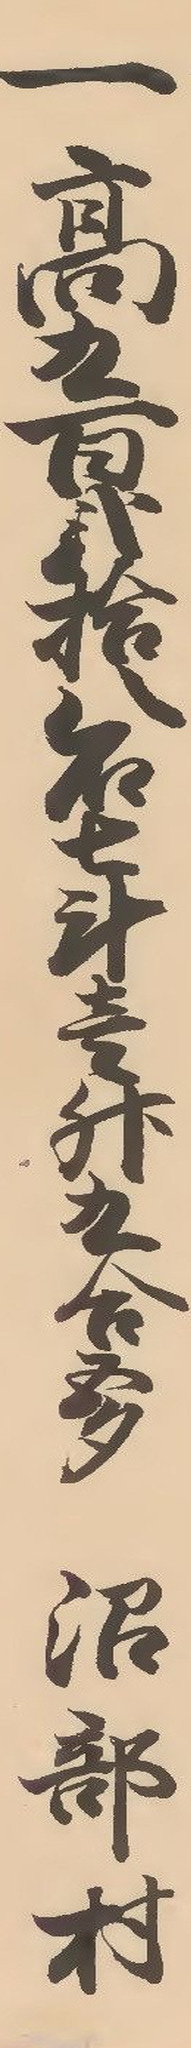一高九百弐拾八石七斗壱升五合五勺沼部村
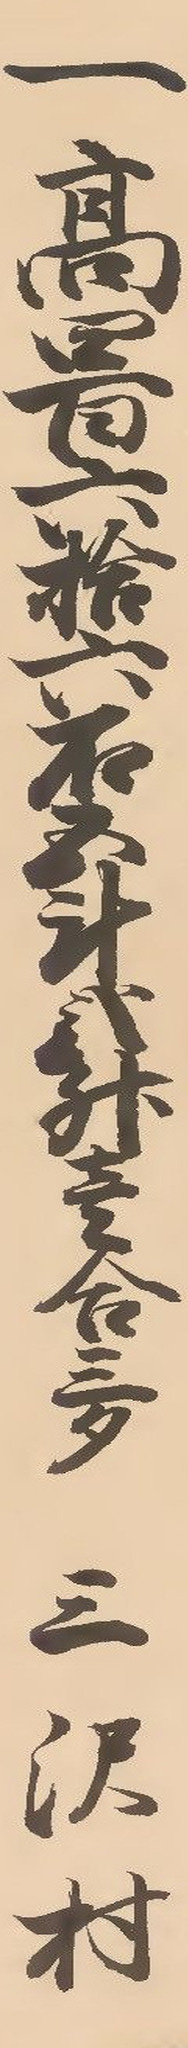一高四百六拾六石五斗弐升壱合三勺三沢村
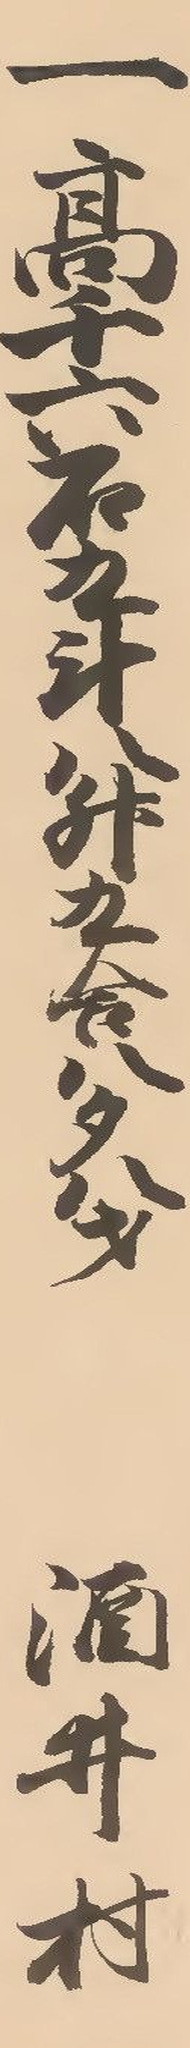一高千六石九斗八升九合八勺八才酒井村
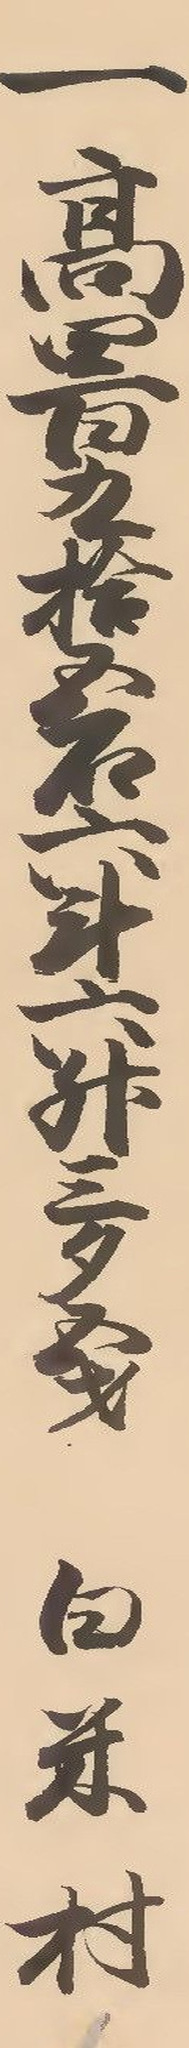一高四百九拾五石六斗六升三勺五才白米村
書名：陸奥国郷帳　３
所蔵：国立公文書館 National Archives of Japan
